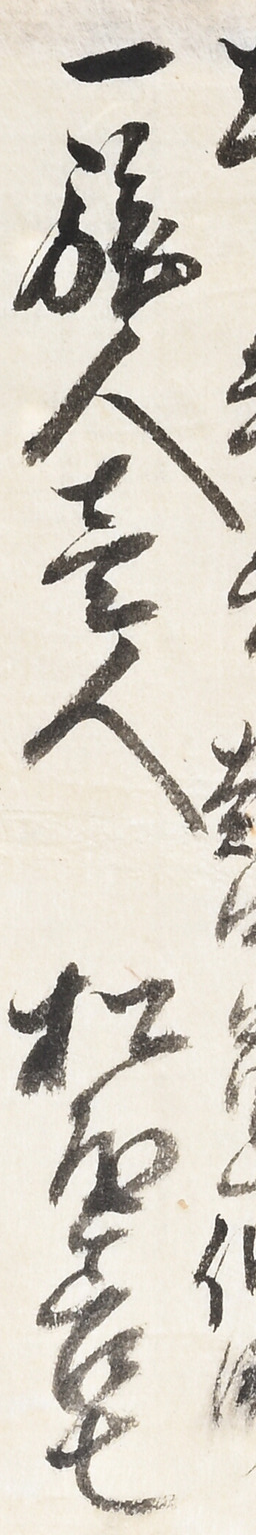一旅人壱人松屋善七
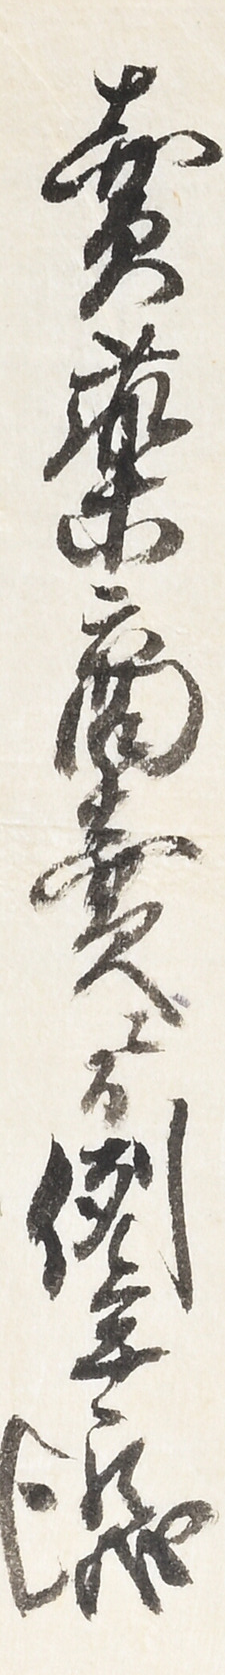売薬商売ニ而例年罷越
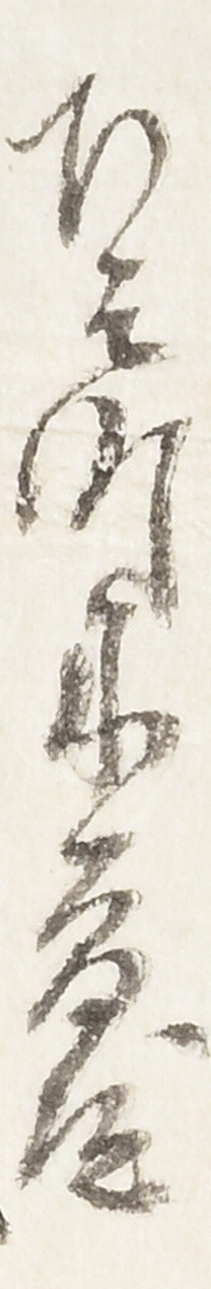下モ町木曽屋
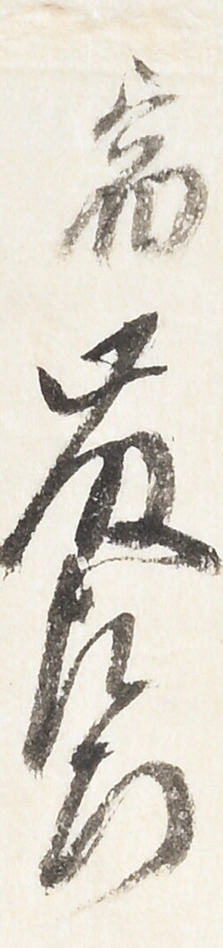宿籐左衛門
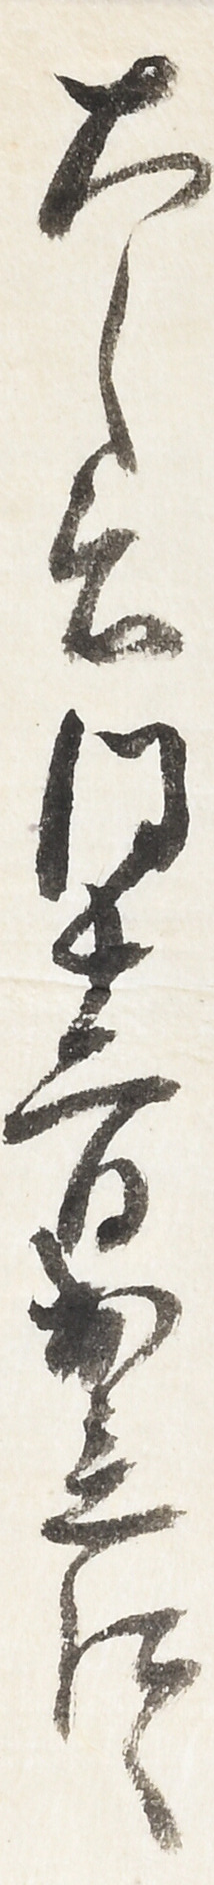右之者同十二日出立仕候
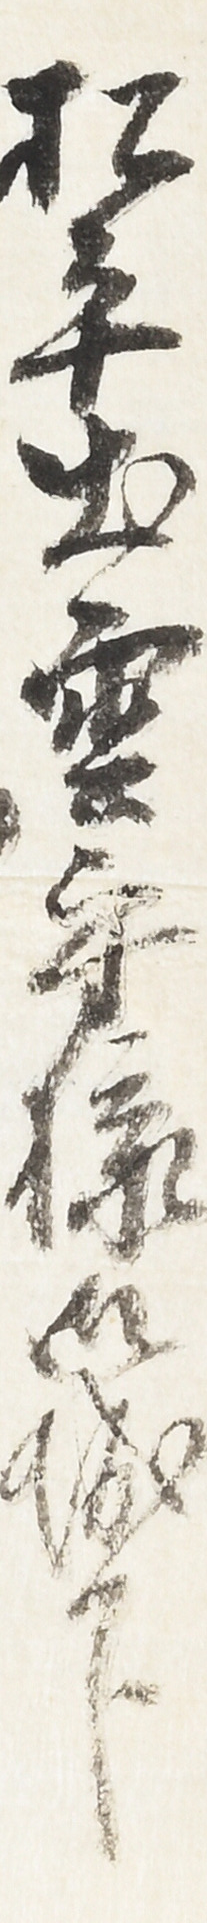松平出雲守様御城下
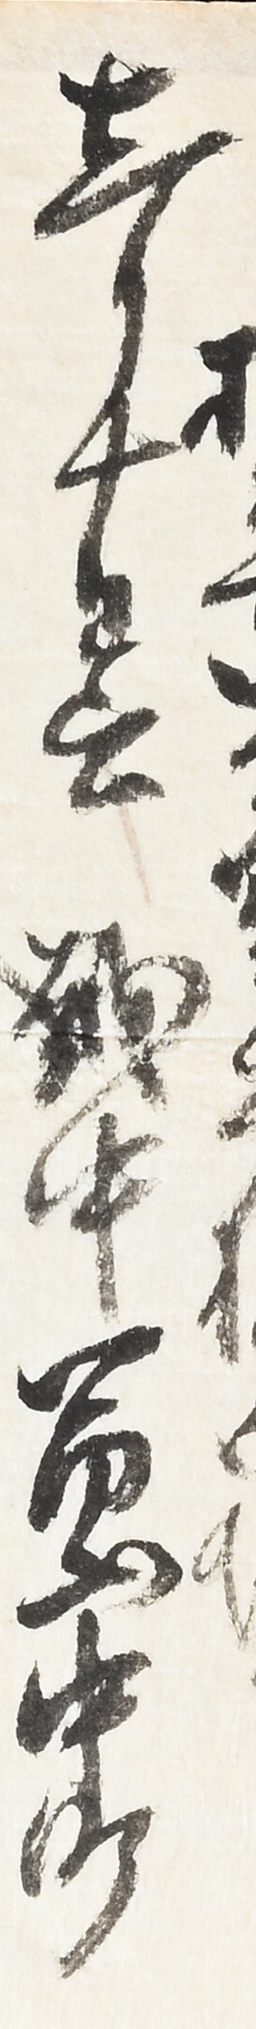十二月十日着越中富山中町
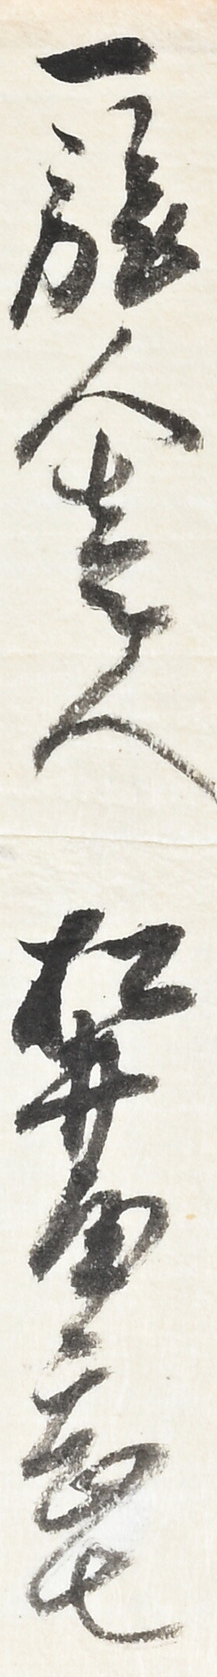一旅人壱人松井屋甚七
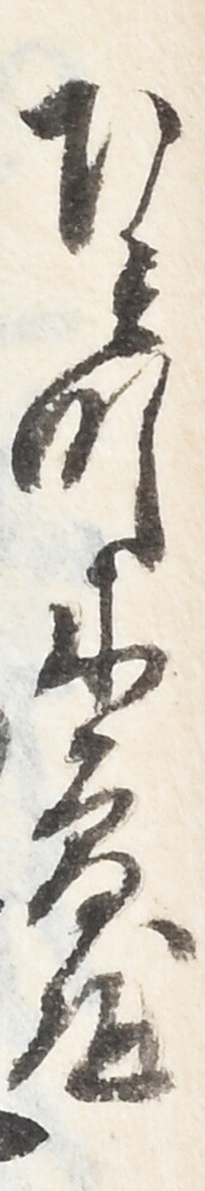下モ町木曽屋
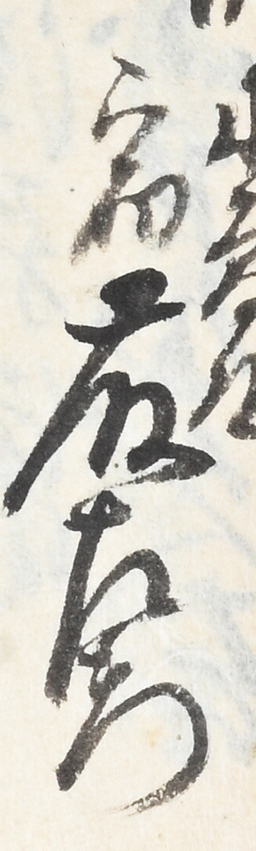宿籐左衛門

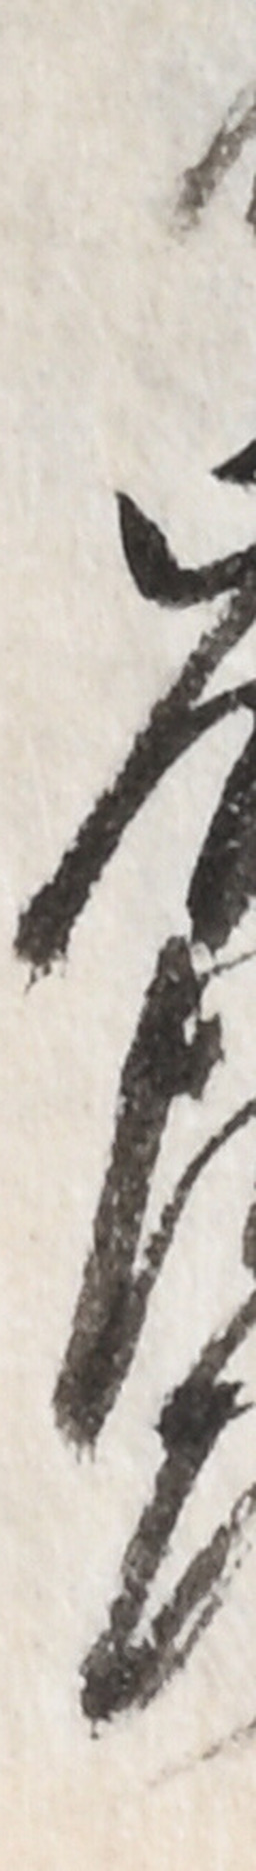十左衛門
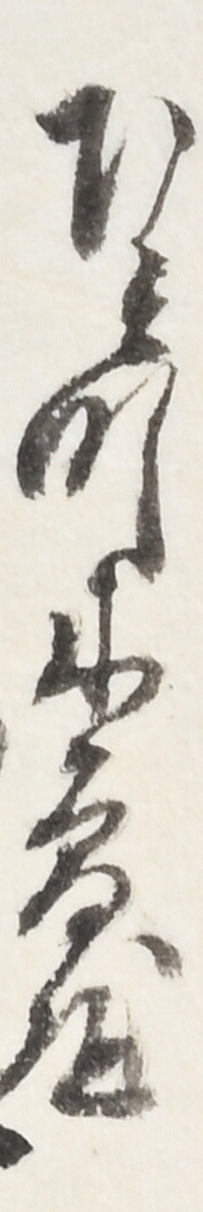下モ町木曽屋
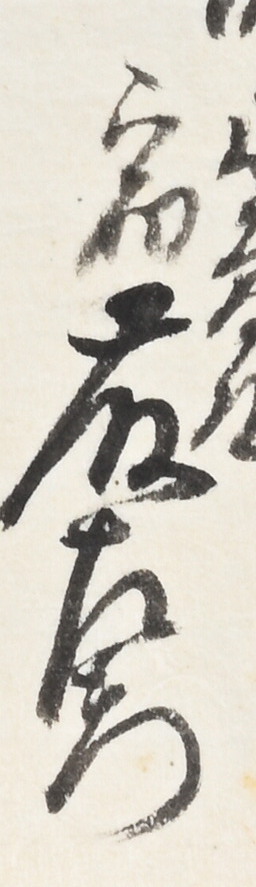宿籐左衛門
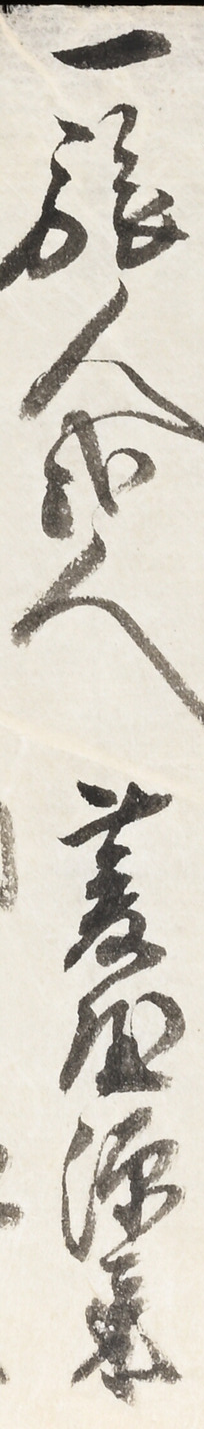一旅人弐人菱屋源兵衛
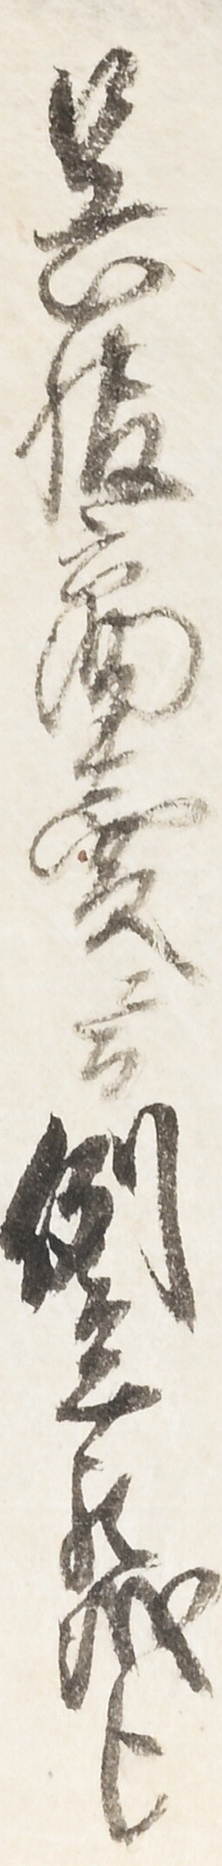呉服商売ニ而例年罷越申候
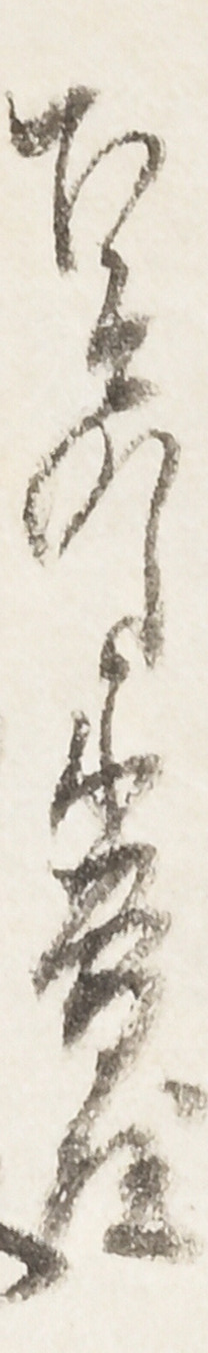下モ町木曽屋
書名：旅人泊控帳
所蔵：伊那市立高遠町図書館・合同会社AMANE
